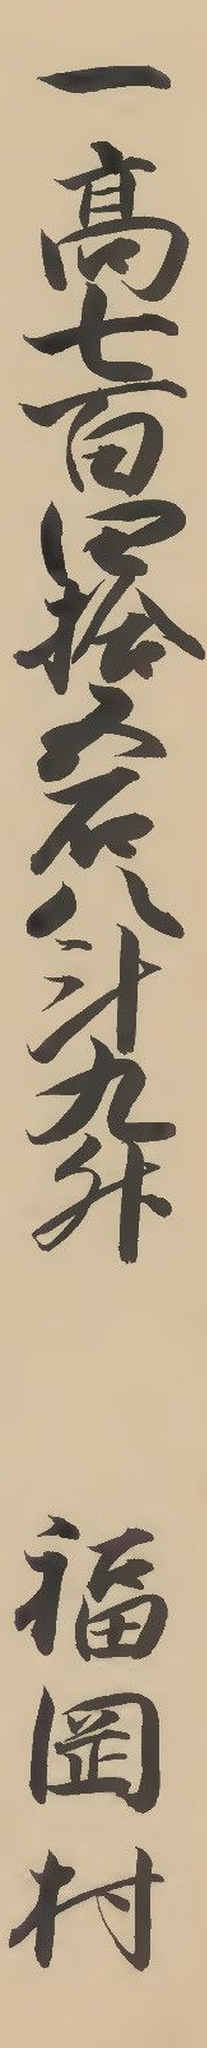一高七百四拾五石八斗九升福岡村
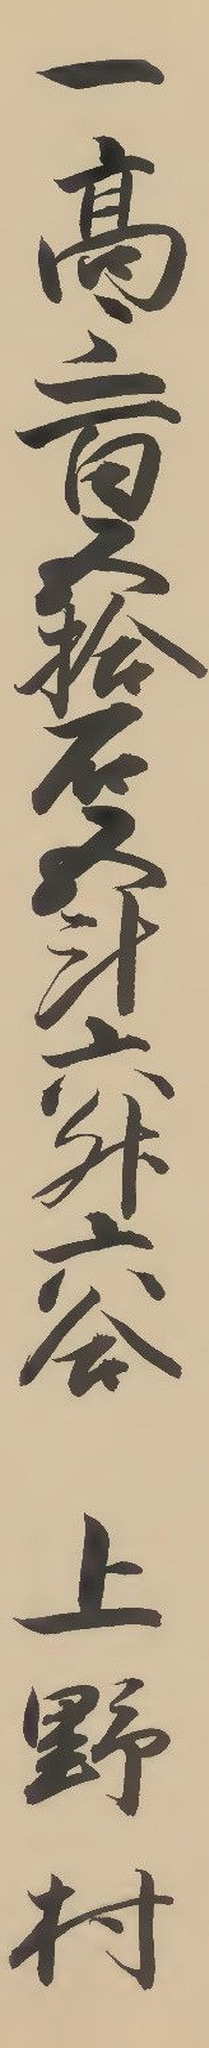一高三百五拾石五斗六升六合上野村
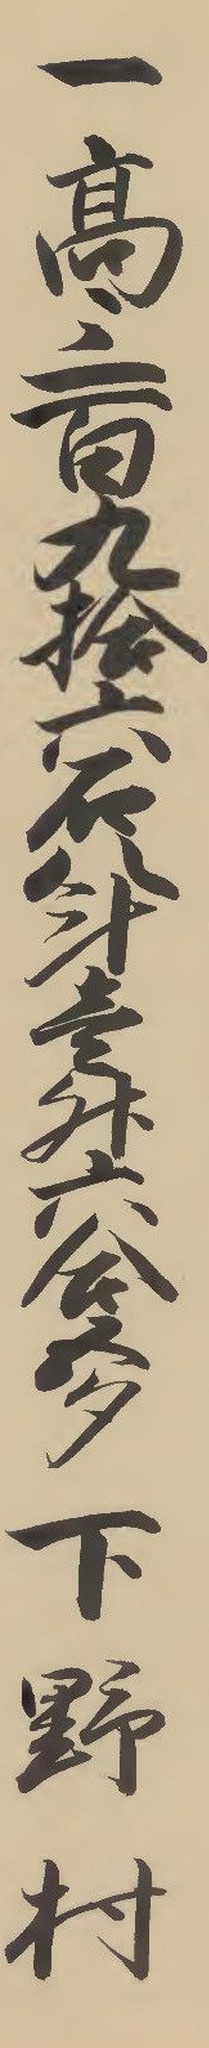一高三百九拾六石八斗壱升六合五勺下野村
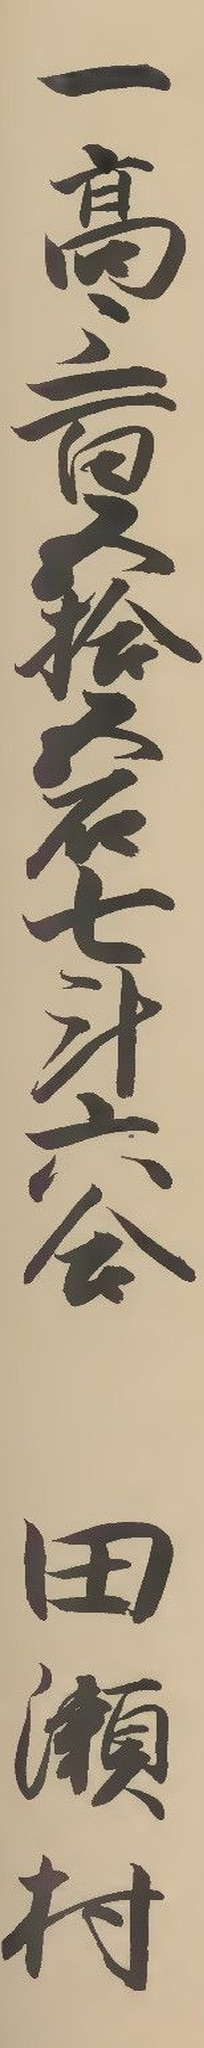一高三百五拾五石七斗六合田瀬村
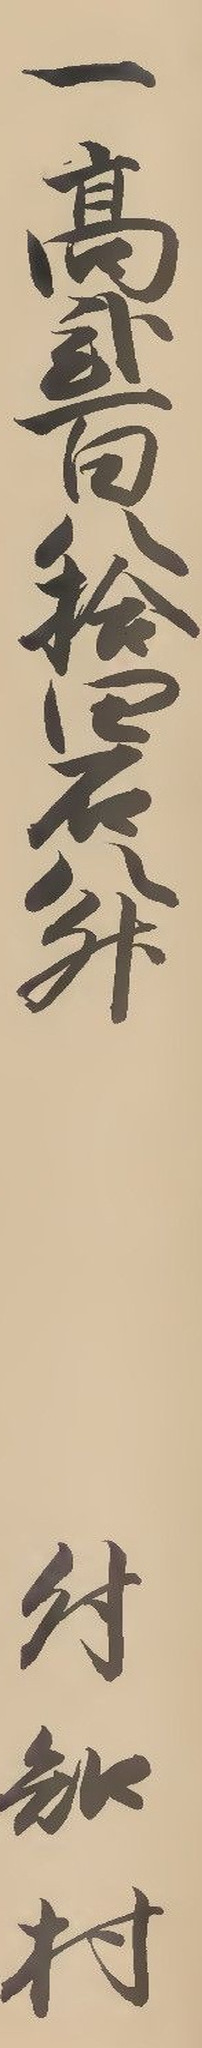一高弐百八拾四石八升付知村
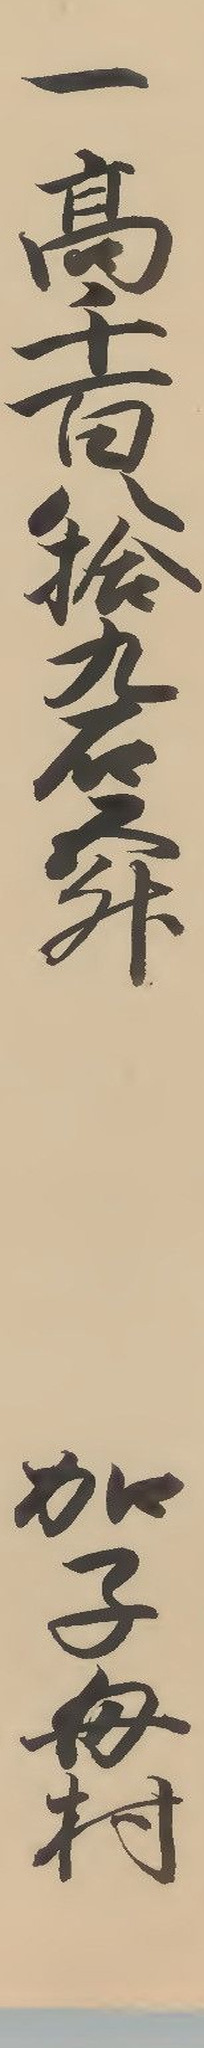一高千百八拾九石五升加子母村
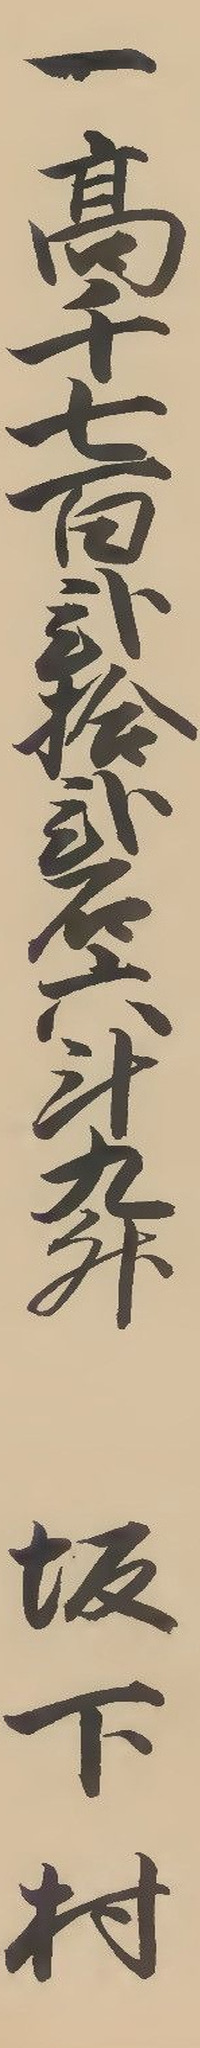一高千七百弐拾弐石六斗九升坂下村

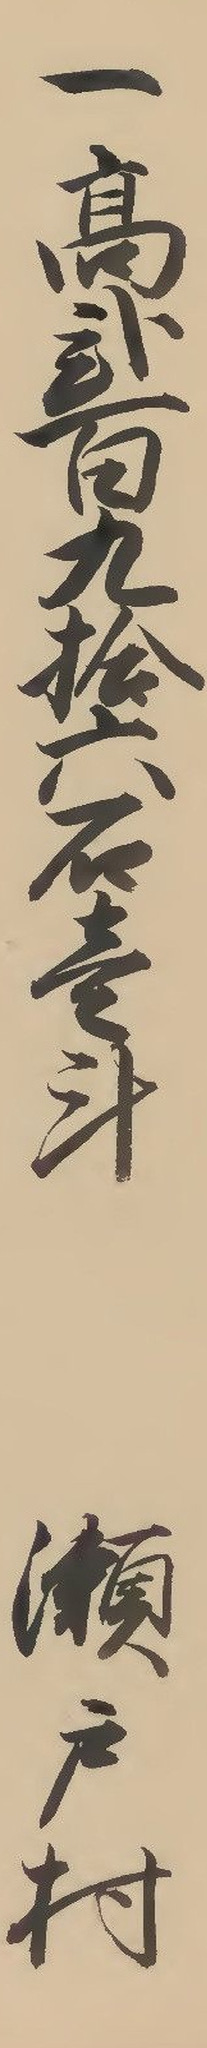一高弐百九拾六石壱斗瀬戸村
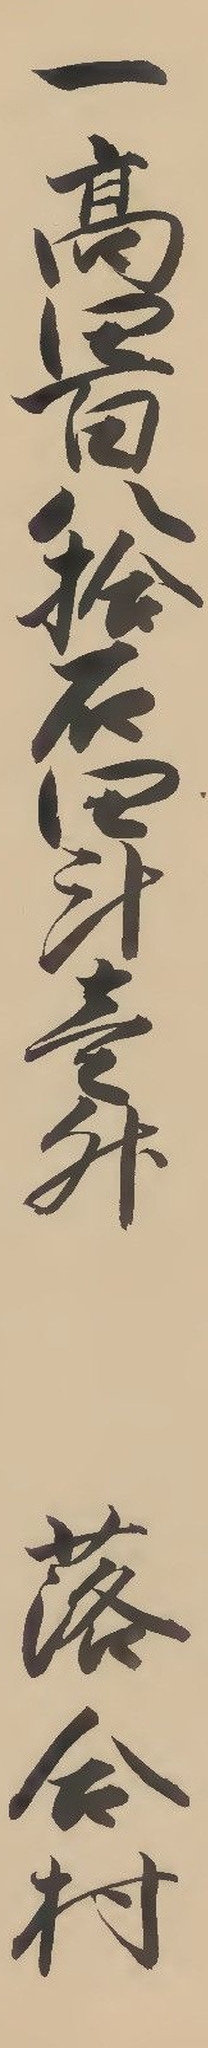一高四百八拾石四斗壱升落合村
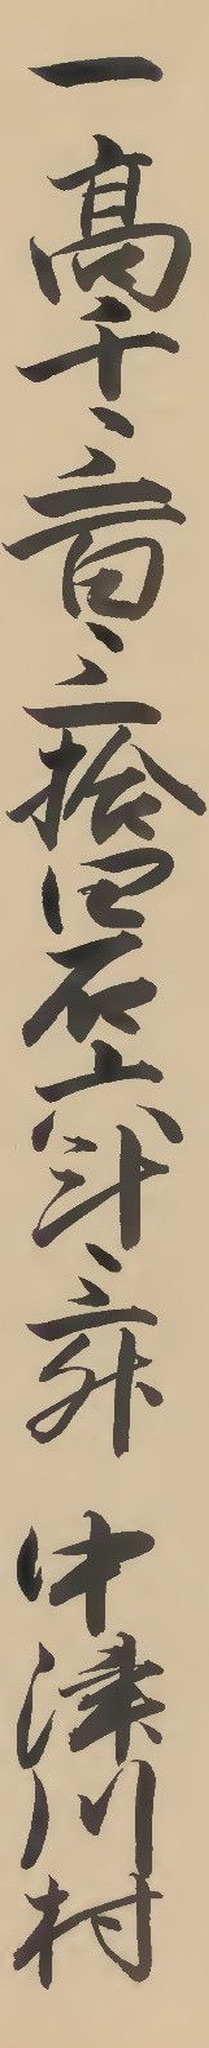一高千三百三拾四石六斗三升中津川村
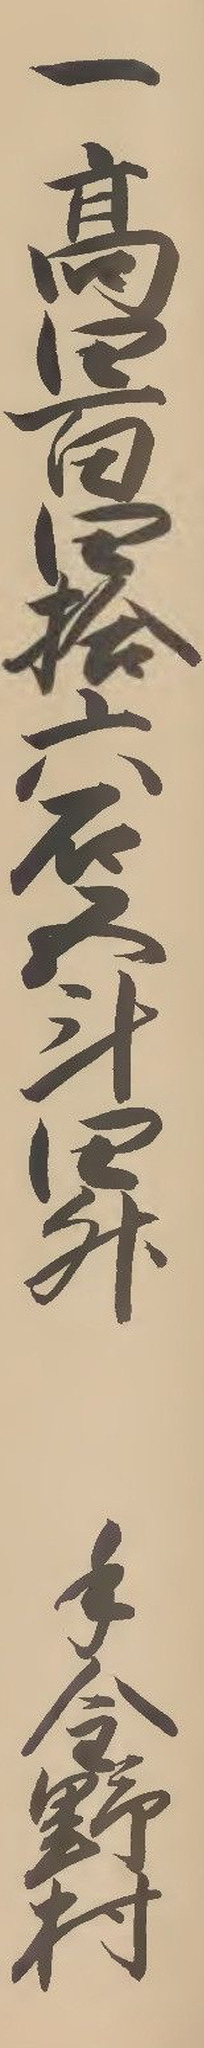一高四百四拾六石五斗四升手金野村
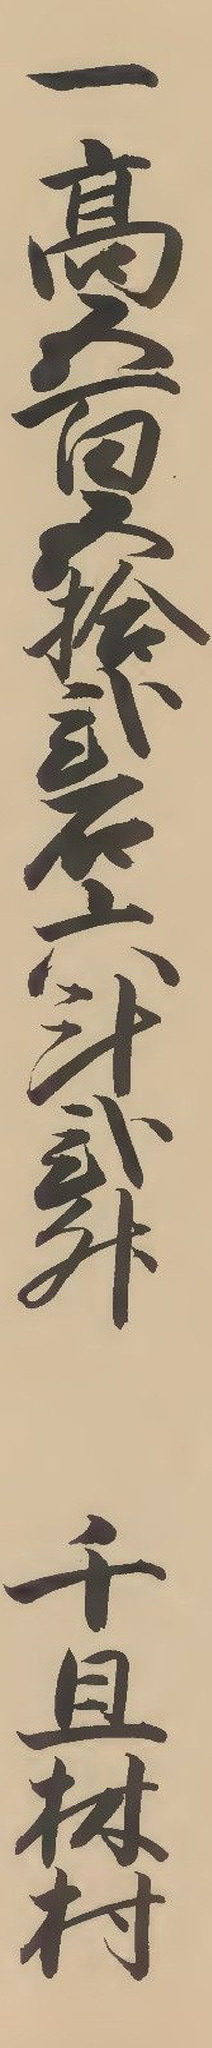一高五百五拾弐石六斗弐升千且林村
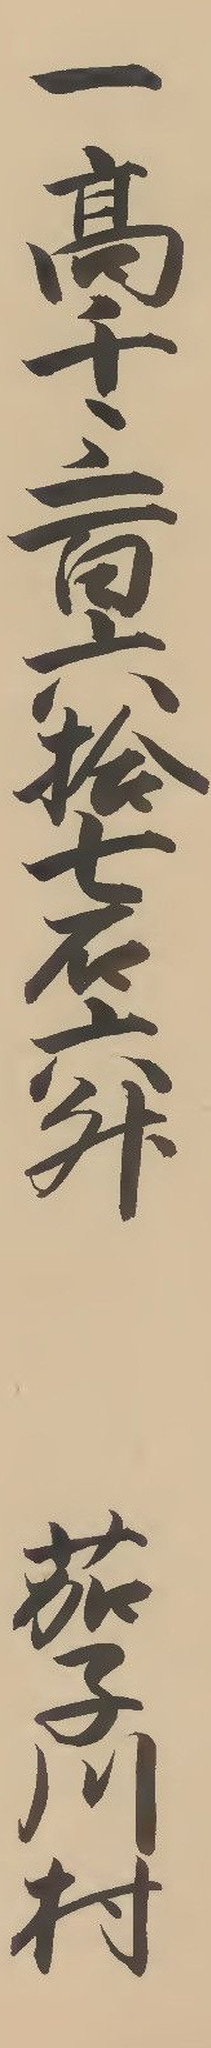一高千三百六拾七石六升茄子川村
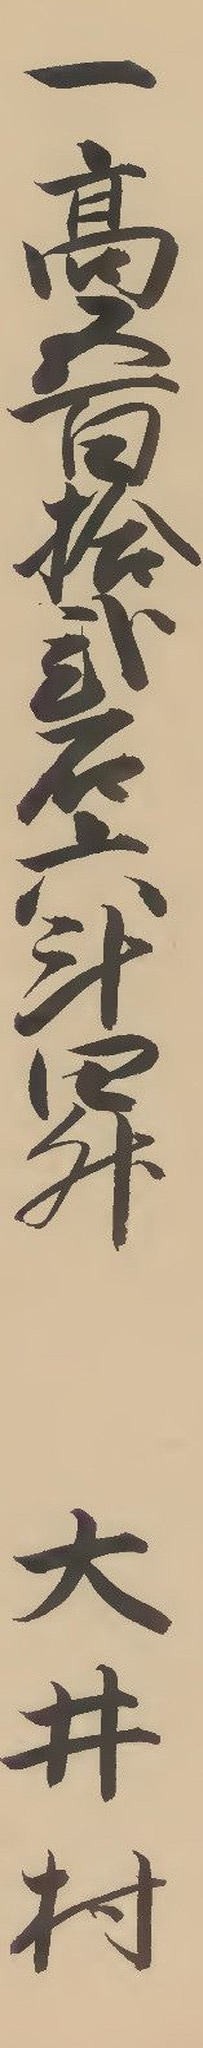一高五百拾弐石六斗四升大井村

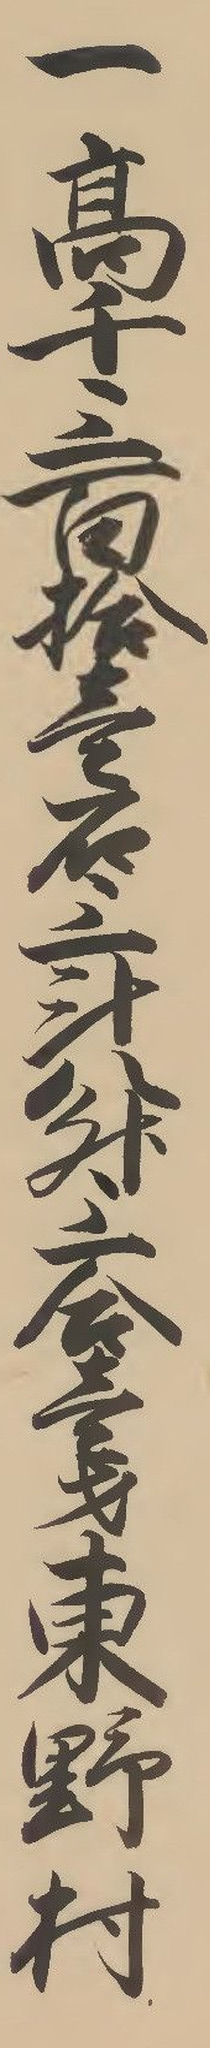一高千三百拾壱石三斗八升三合壱才東野村
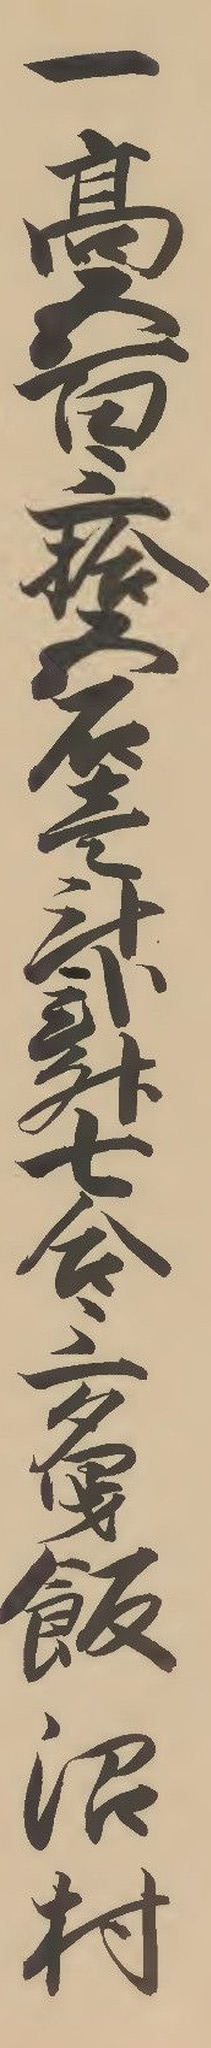一高五百三拾五石壱斗弐升七合三勺四才飯沼村
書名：美濃国郷帳
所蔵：国立公文書館 National Archives of Japan
